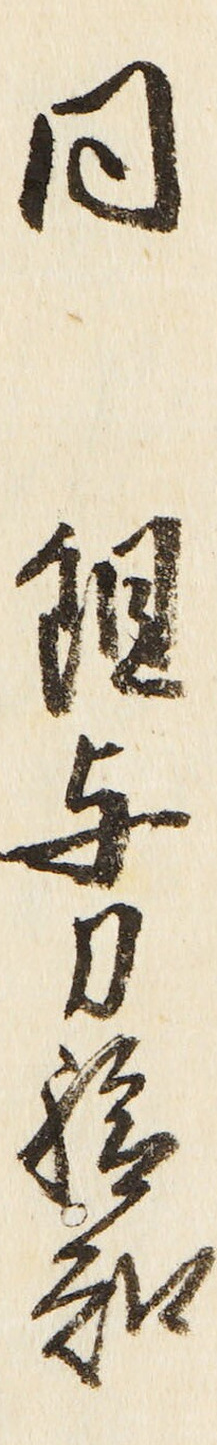同組与力給知
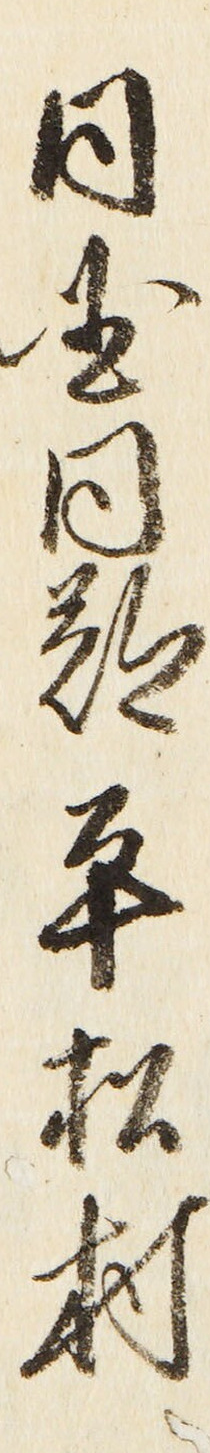同国同郡平松村

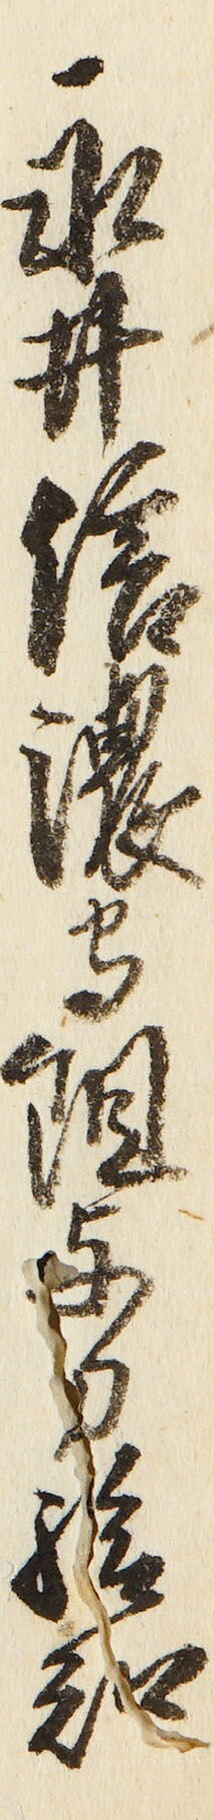永井信濃守組与力給知
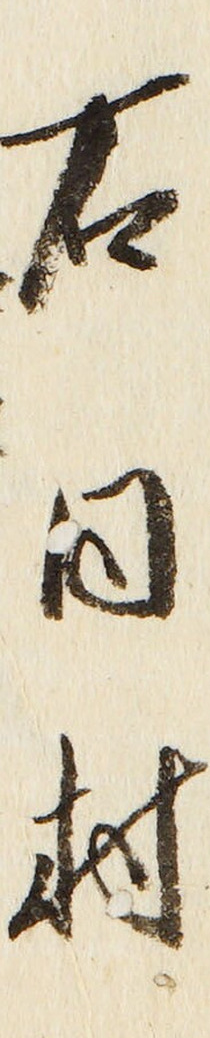右同村
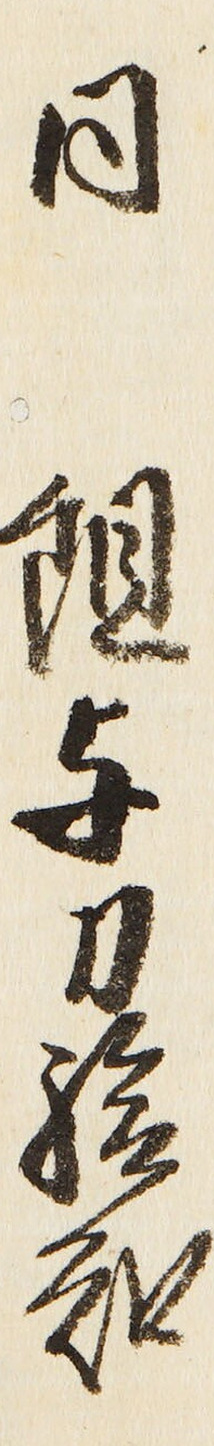同組与力給知
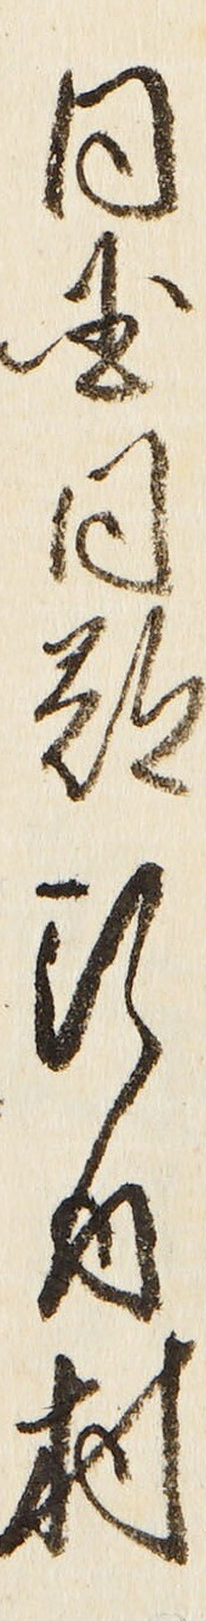同国同郡行内村
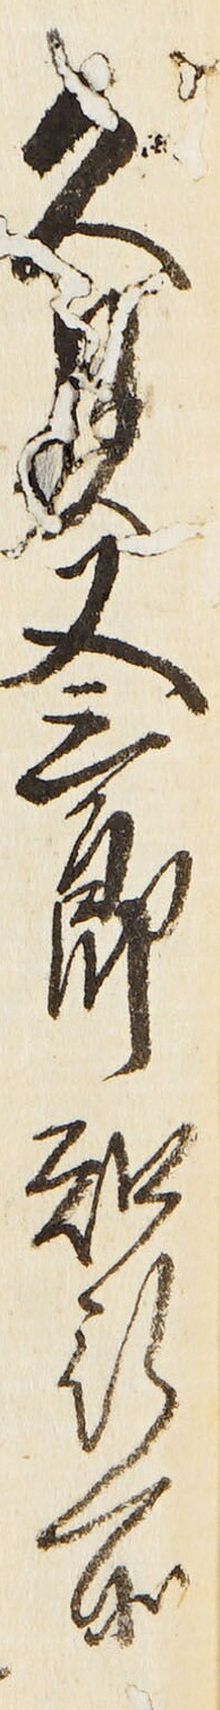久又三郎知行所
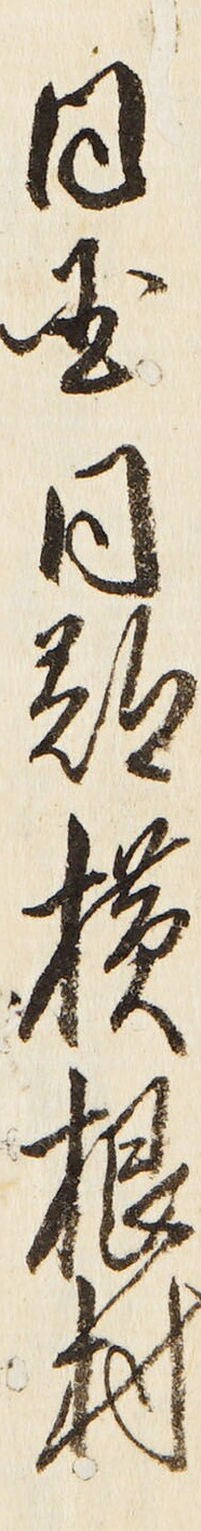同国同郡横根村
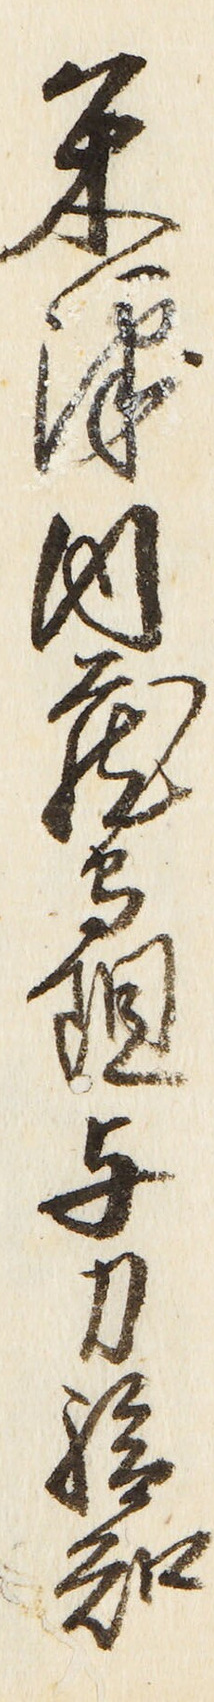米津内蔵守組与力給知
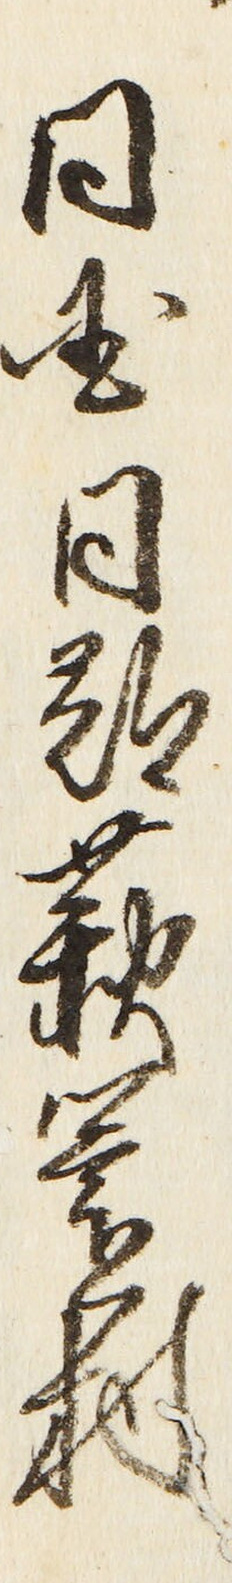同国同郡萩園村

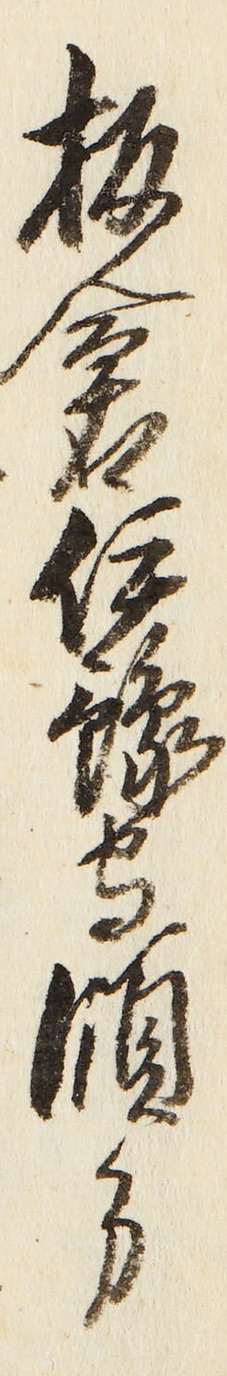板倉伊予守領分
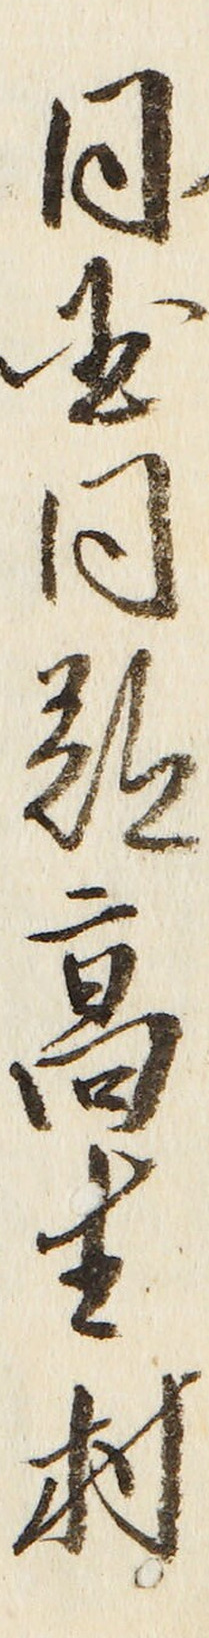同国同郡高生村
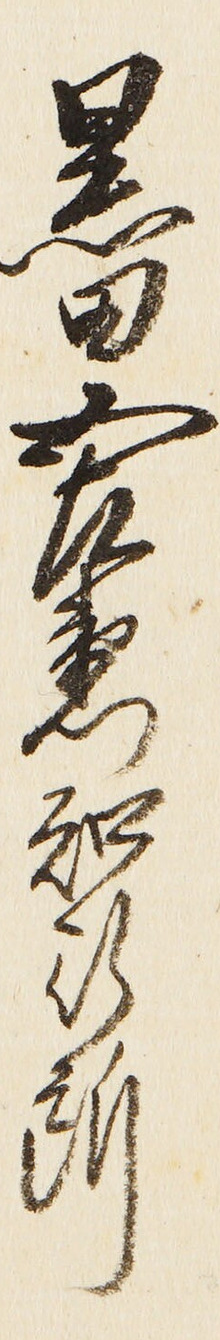黒田五左衛門知行所
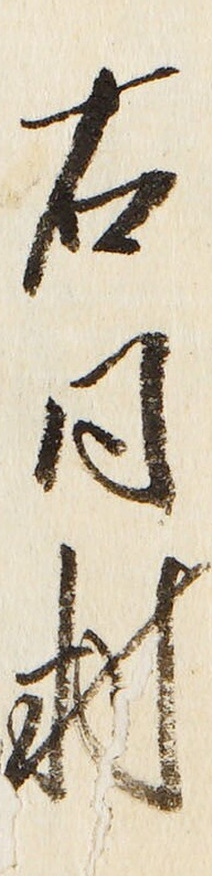右同村
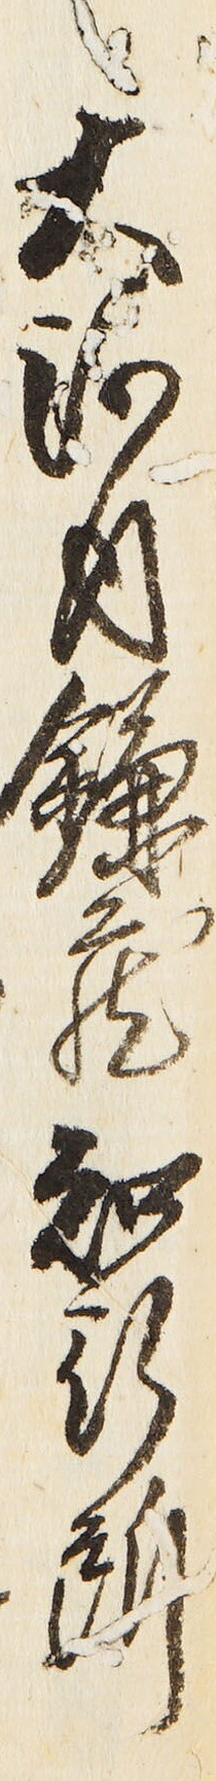大河内鎌蔵知行所
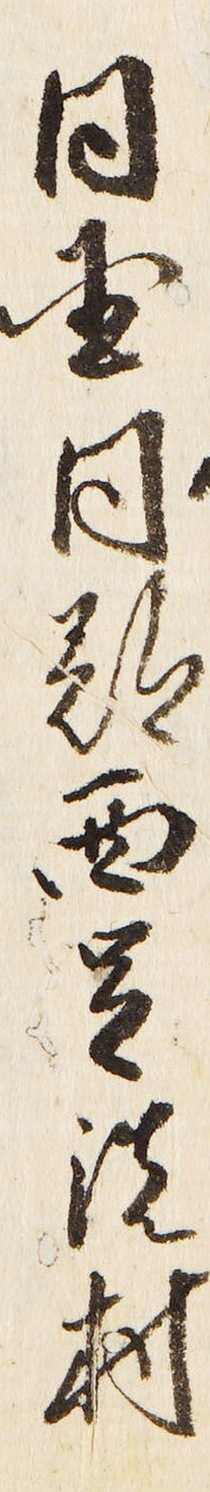同国同郡西足洗村
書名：難船一件記録
